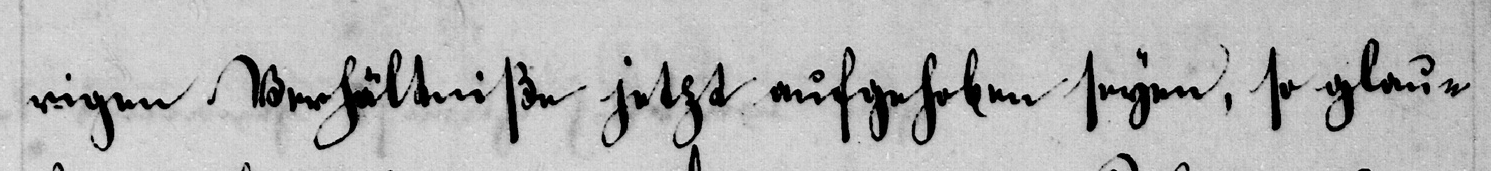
rigen Verhältniße jetzt aufgehoben seyen, so glau¬
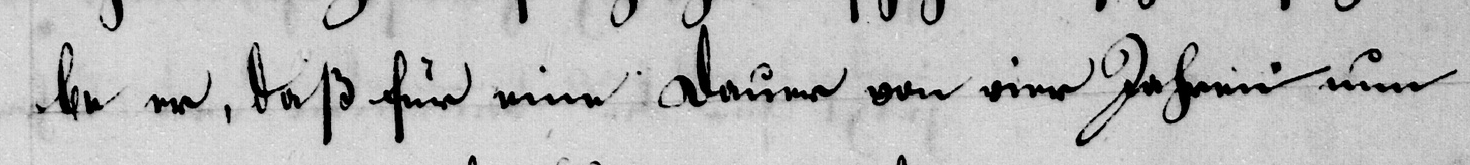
be er, daß für eine Dauer von vier Jahren nun
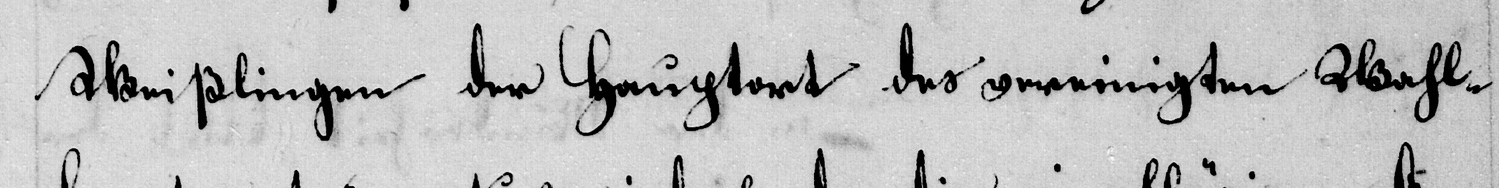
Weißlingen der Hauptort des vereinigten Wahl¬
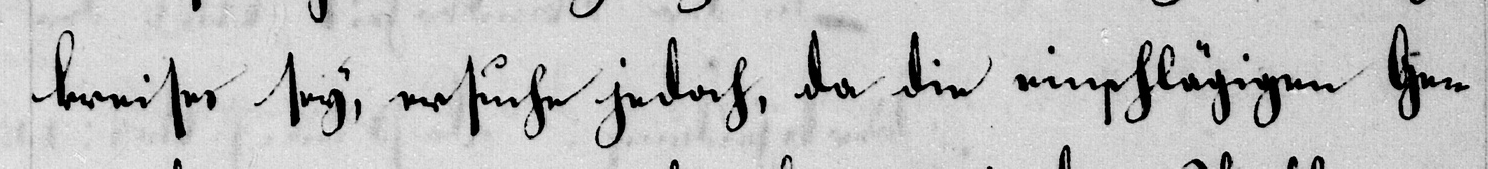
kreises sey, ersuche jedoch, da die einschlägigen Ge¬
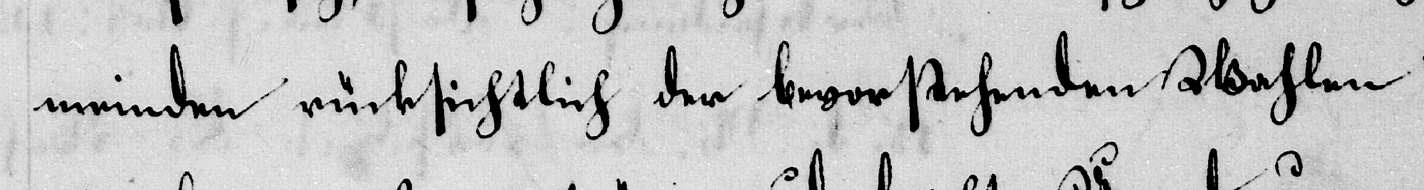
meinden rücksichtlich der bevorstehenden Wahlen
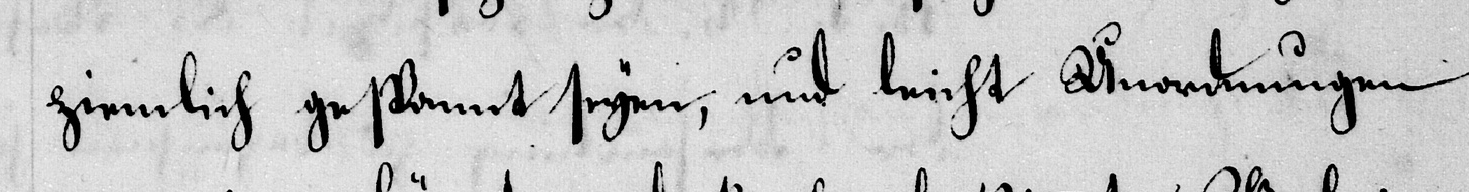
ziemlich gespannt seyen, und leicht Unordnungen
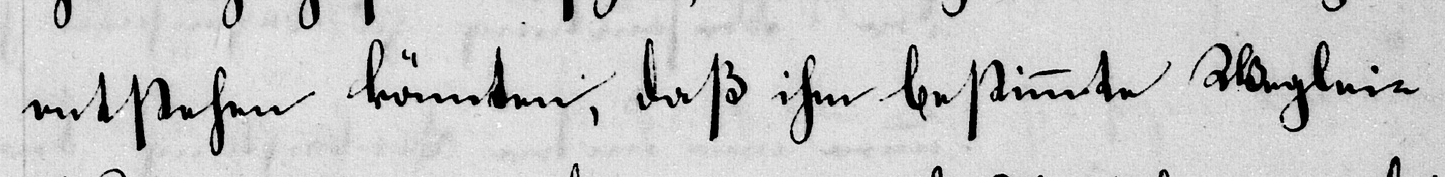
entstehen könnten, daß ihm bestimmte Weglei¬
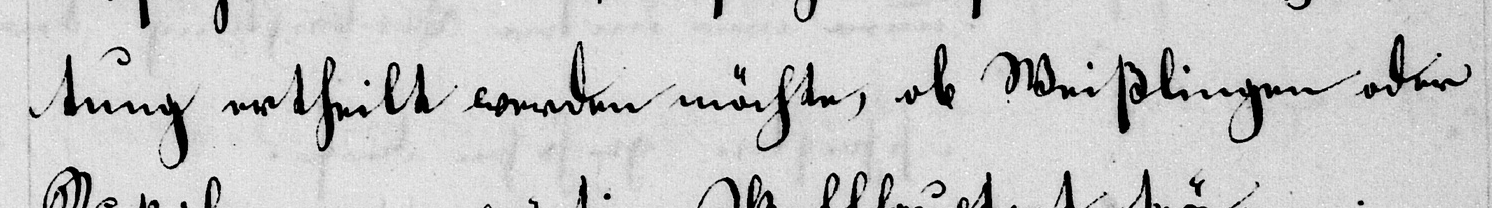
tung ertheilt werden möchte, ob Weißlingen oder
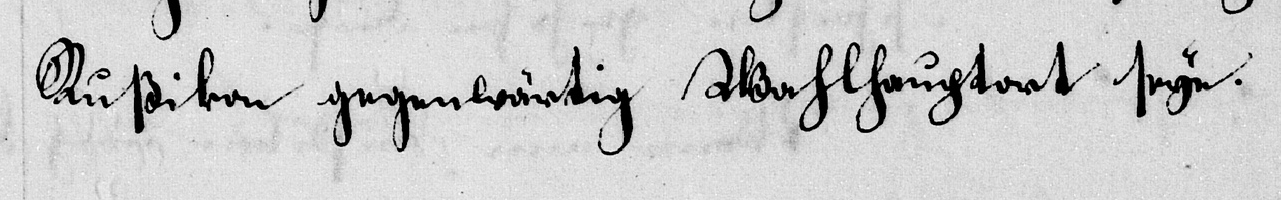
Rußikon gegenwärtig Wahlhauptort seye.
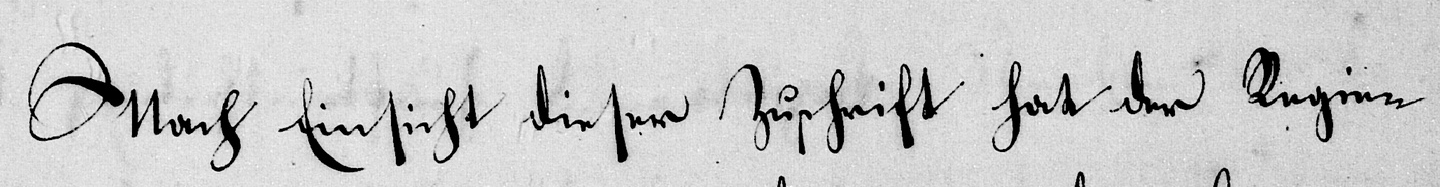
Nach Einsicht dieser Zuschrift hat der Regie¬
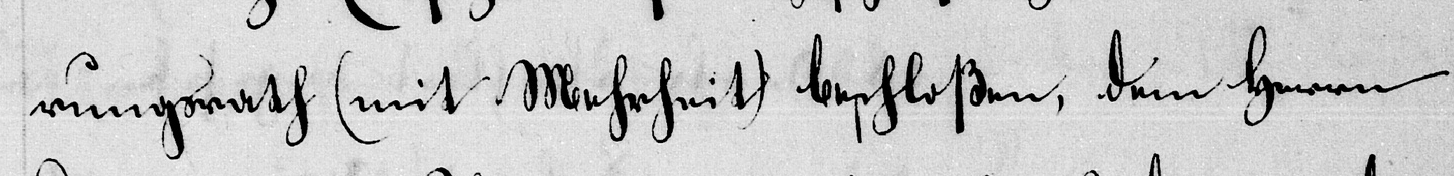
rungsrath (mit Mehrheit) beschloßen, dem Herrn
